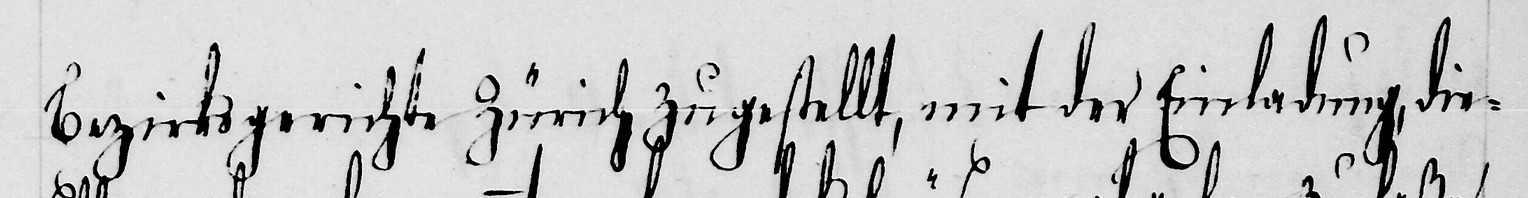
Bezirksgerichte Zürich zugestellt, mit der Einladung, die¬
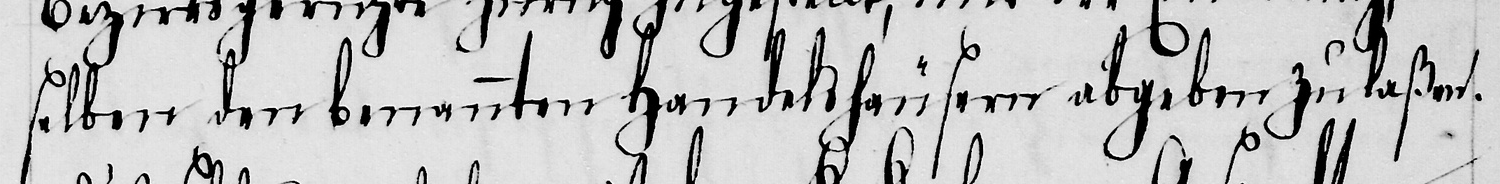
selben den benannten Handelshäusern abgeben zu laßen.
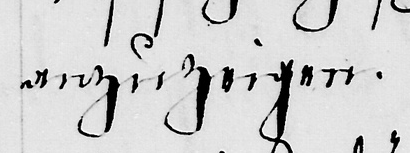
anzuzeigen.
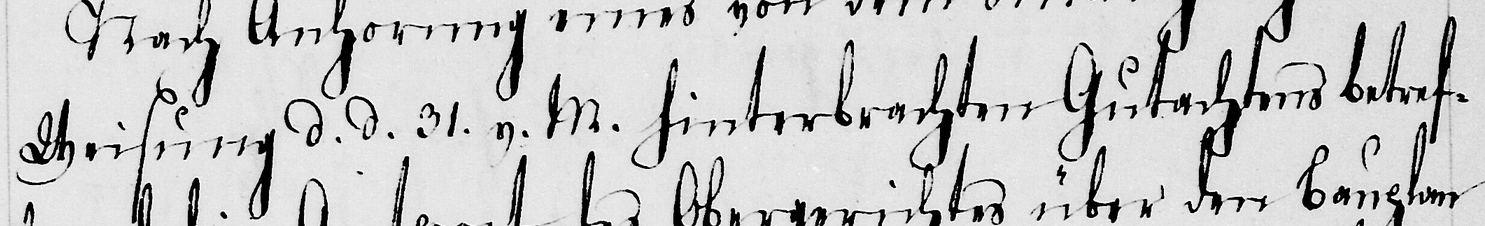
Weisung d. d. 31. v. M. hinterbrachten Gutachtens betref¬
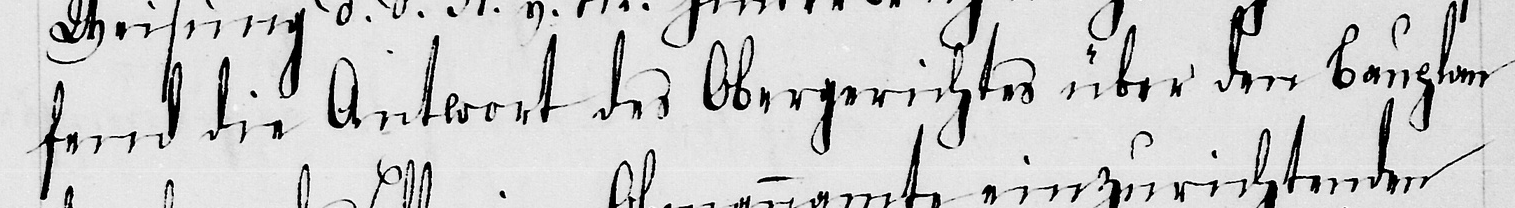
fend die Antwort des Obergerichtes über den Bauplan
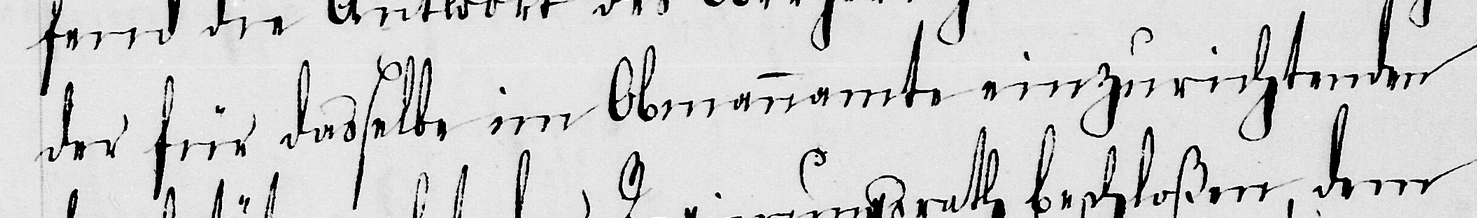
der für dasselbe im Obmannamte einzurichtenden
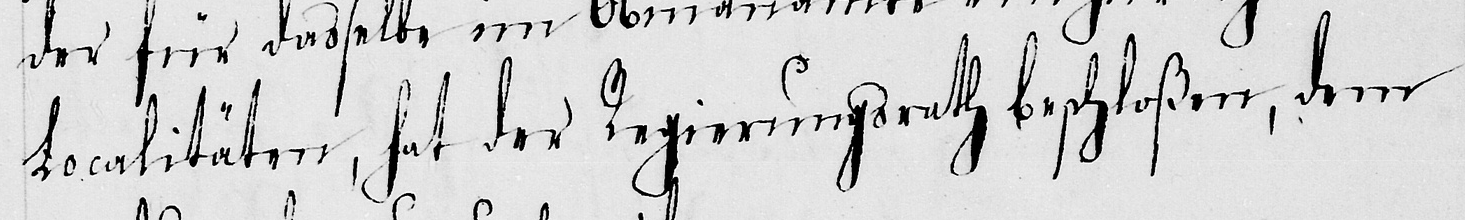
Localitäten, hat der Regierungsrath beschloßen, dem
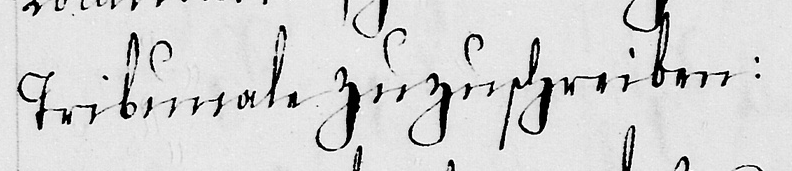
Tribunale zuzuschreiben:
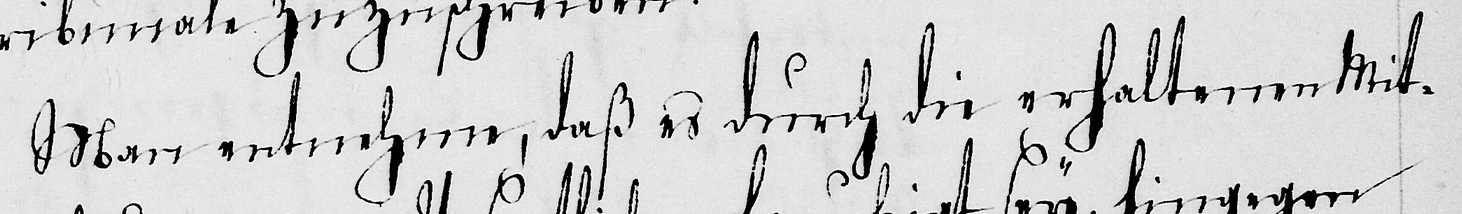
Man entnehme, das es durch die erhaltenen Mit¬
